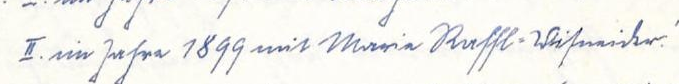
II im 1899 mit Maria Raffl-Visneider.“
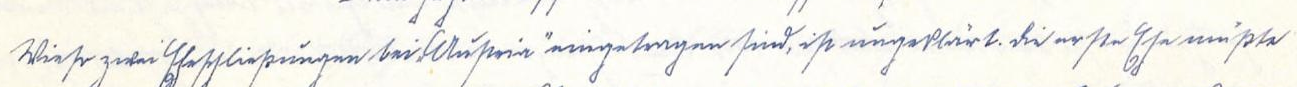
Wieeso zwei Eheschließungen bei Austria eingetragen sind, ist ungeklärt. Die erste Ehe müsste
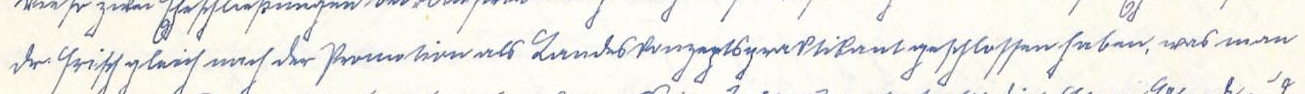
der Frisch gleich nach der Promotion als Landeskonzeptpraktikant geschlossen haben, was man dem
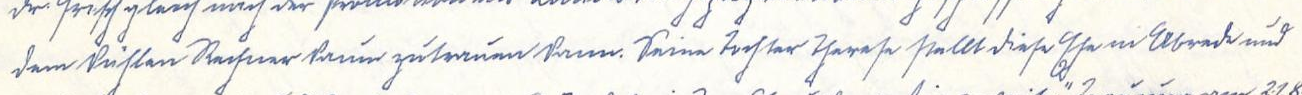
kühlen Rechner kaum zutrauen kann. Seine Tochter Therese stellt diese Ehe in Abrede und
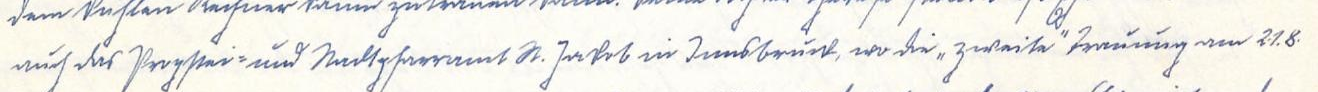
auch das Propstei und Stadtspfarramt St. Jakob in Innsbruck, wo die „zweite“ Trauung am 21.8.
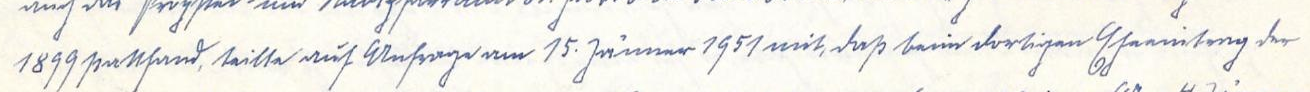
1899 stattfand, teilte auf Anfrage am 15. Jänner 1951 mit, dass beim dortigen Eheeintrag der
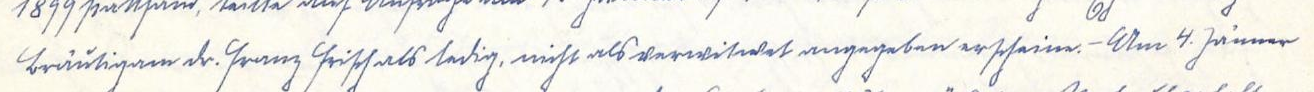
Bräutigam Dr. Franz Frisch als ledig, nicht als verwitwet angegeben erschien.- Am 4. Januar 1949
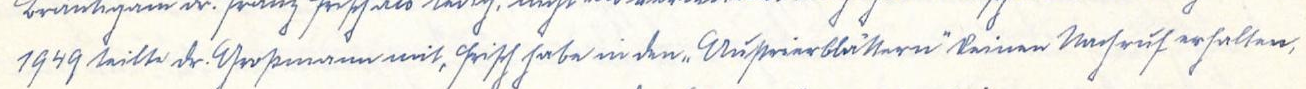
teilte Dr. Großmann mit, Frisch habe in den „Austrierblättern“ keinen Nachruf erhalten,
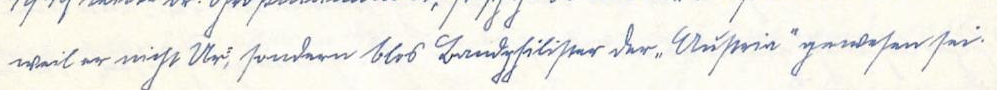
weil er nicht Ur- sondern bloß Bandphilister der „Austria“ gewesen sei.
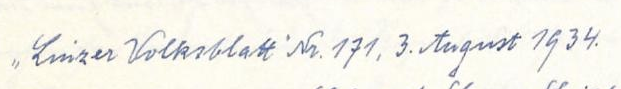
„Linzer Volksblatt“, Nr. 171, 3. August 1934.
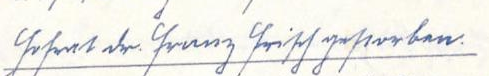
Hofrat Dr. Franz Frisch gestorben
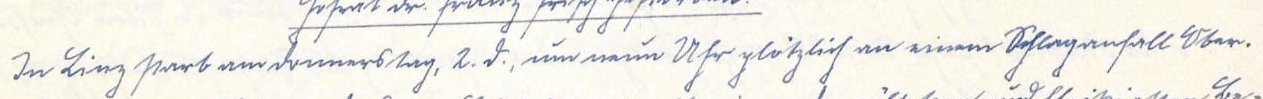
In Linz starb am Donnerstag, 2 d. um neun Uhr plötzlich an einem Schlaganfall Ober-
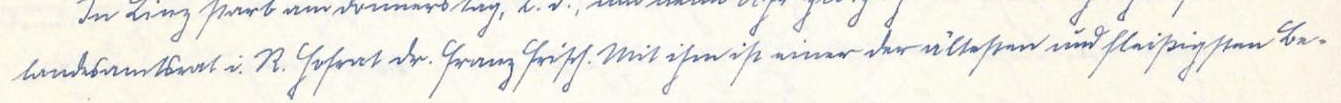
landesamtsrat i.R. Hofrat Dr. Franz Frisch. Mit ihm ist einer der ältesten und fleißigsten Be-
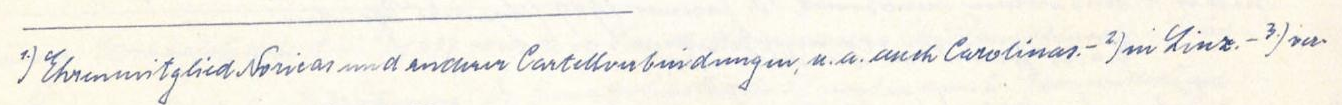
1) Ehrenmitglied Noricas und anderer Cartellverbindungen, u. a. Carolinas.- 2) In Linz.- 3) na-
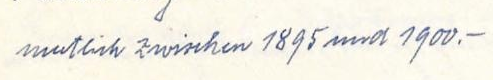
mentlich zwischen 1895 und 1900.-
